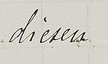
u halte
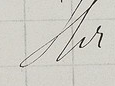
Sie
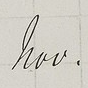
Ihrer
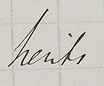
Neben
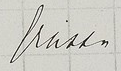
Ihnen zu
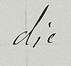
Mit
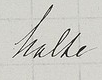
Welti
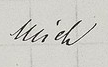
Nov. 1876.
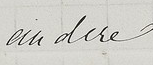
heute hier
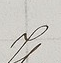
Ihnen
